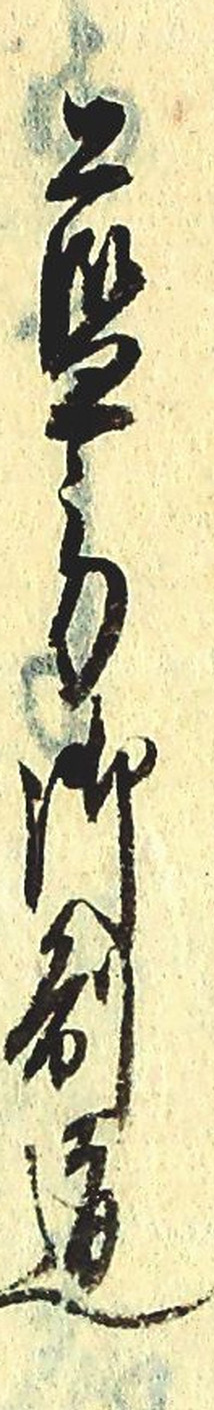藍方御制道
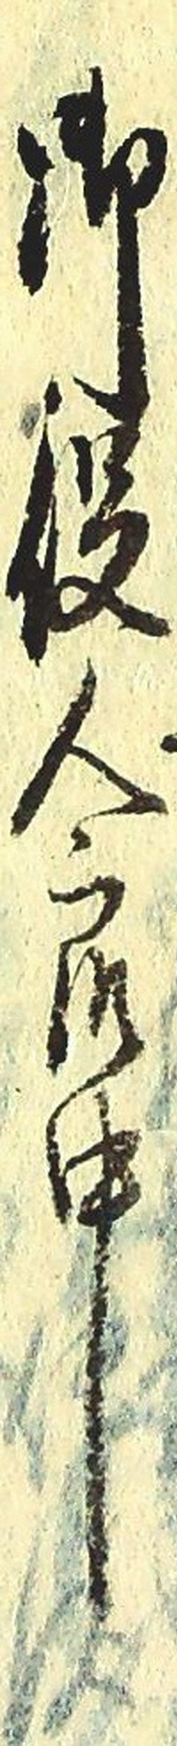御役人衆中
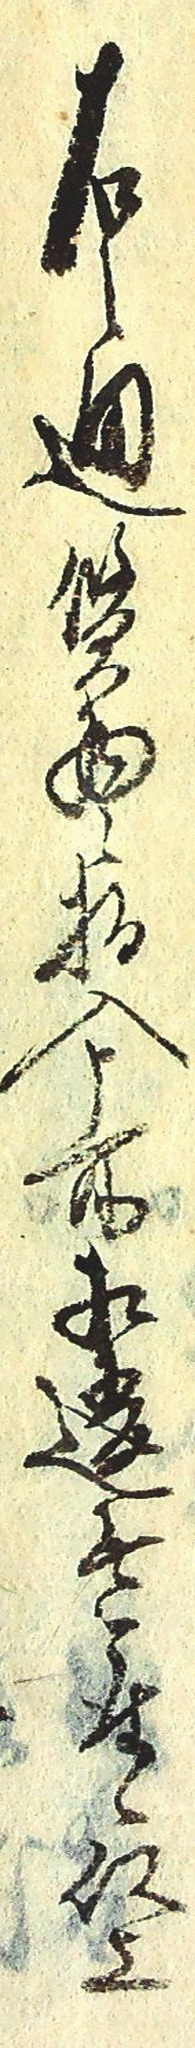右之通質物に指入申所相違無御座候以上
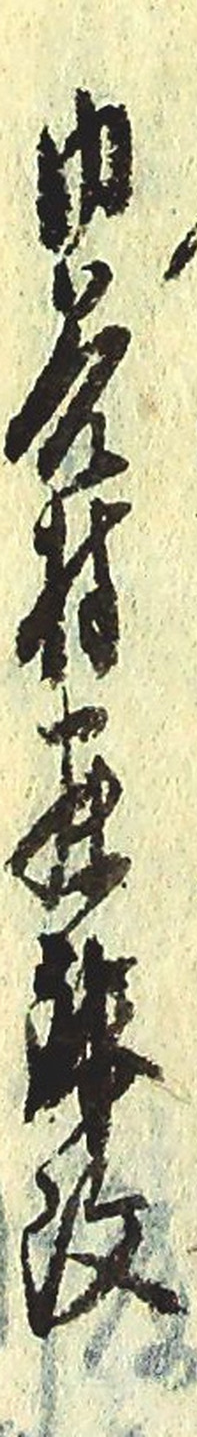内谷村寐床改
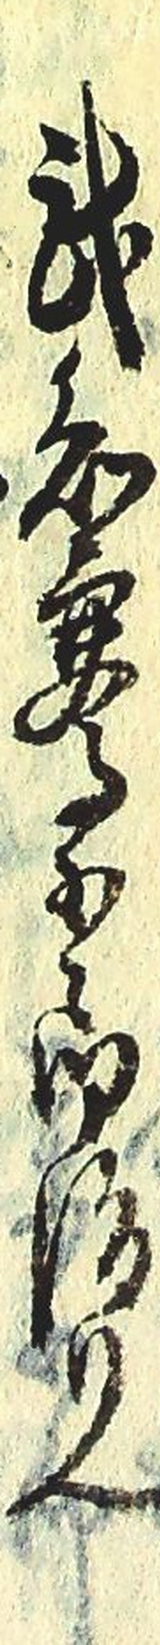武知騫五郎後見
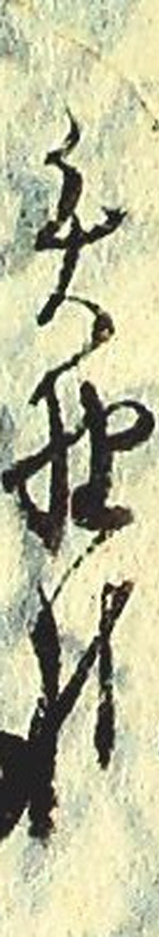矢野村
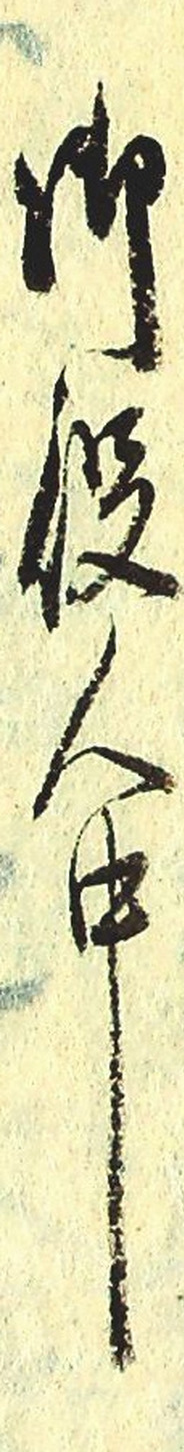御役人中
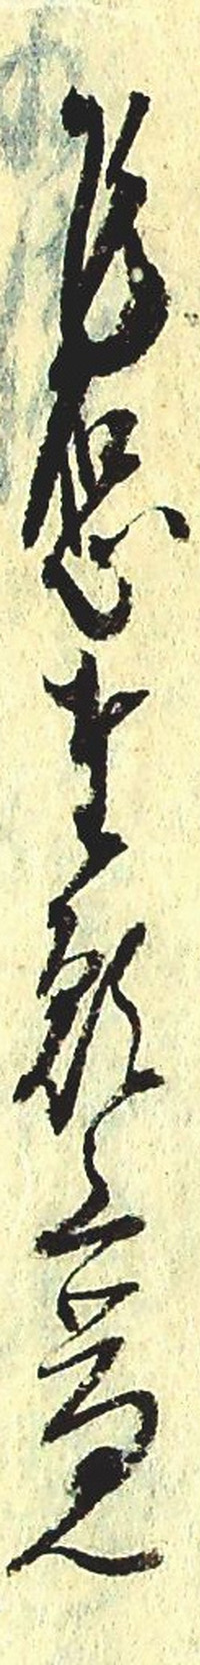乍恐奉願上覚
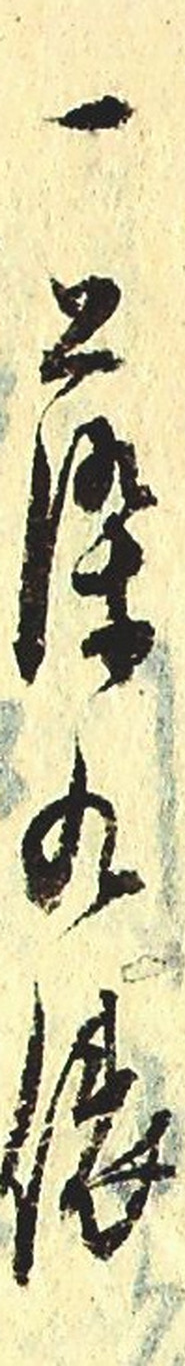一蒅九俵
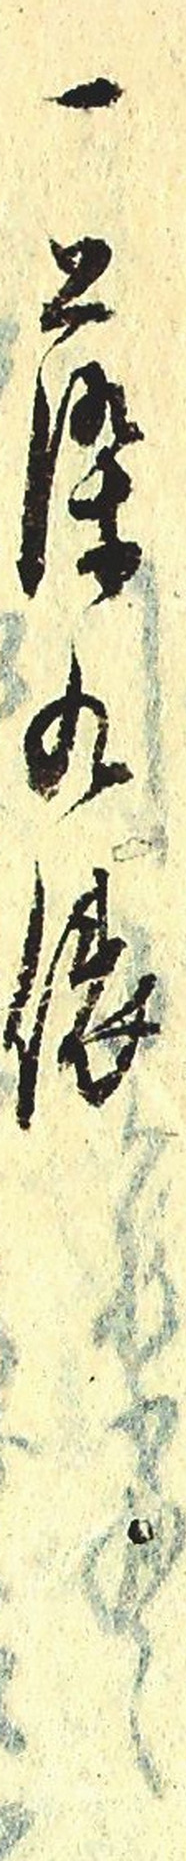一蒅九俵
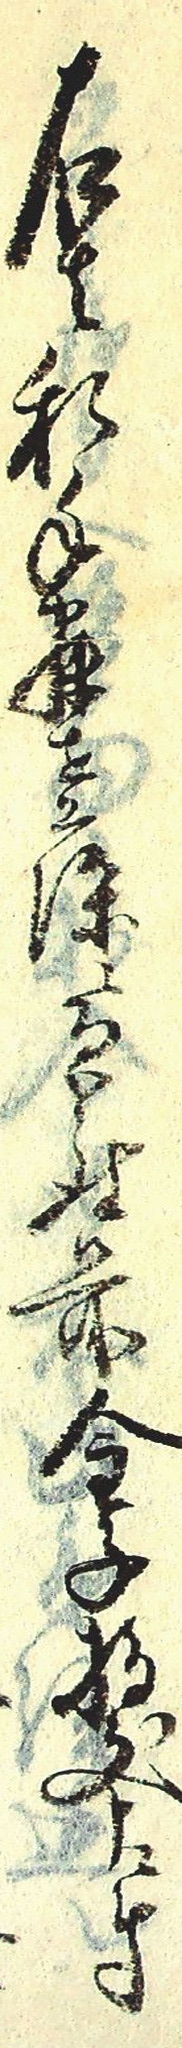右は私手寐せ蒅にて御座候所金子指支申に付
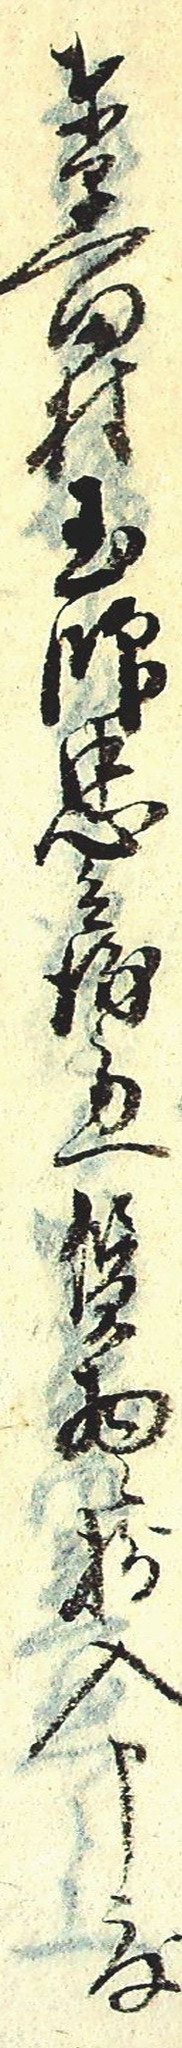東黒田村玉師忠兵衛方へ質物に指入申度
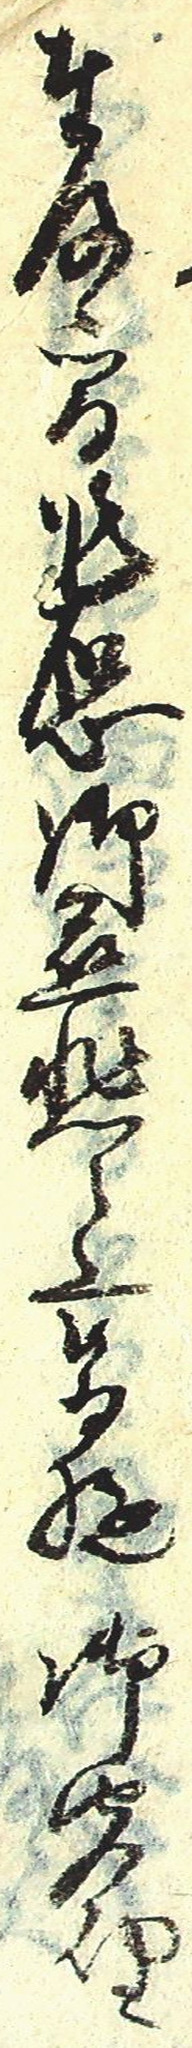奉存候間乍恐御慈悲之上被為遊御聞届

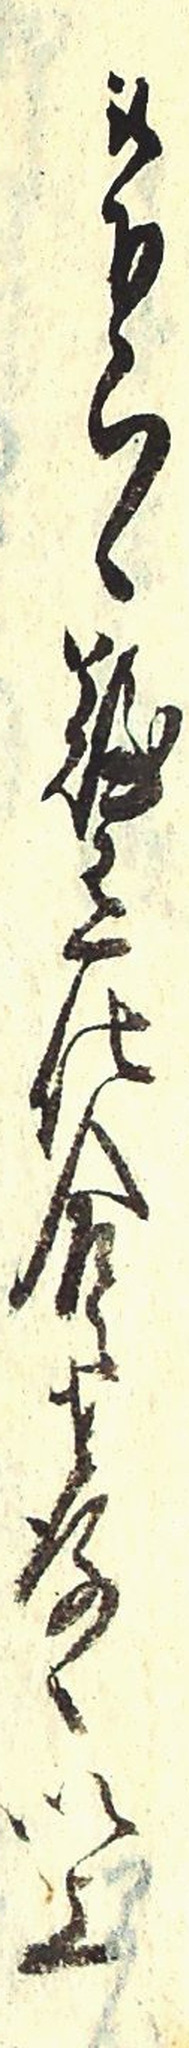被下候はゝ難有仕合に奉存候以上
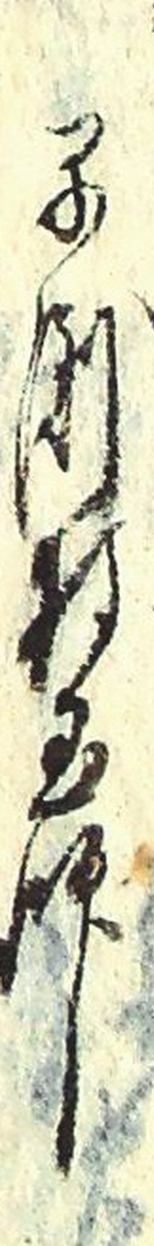早淵村玉師
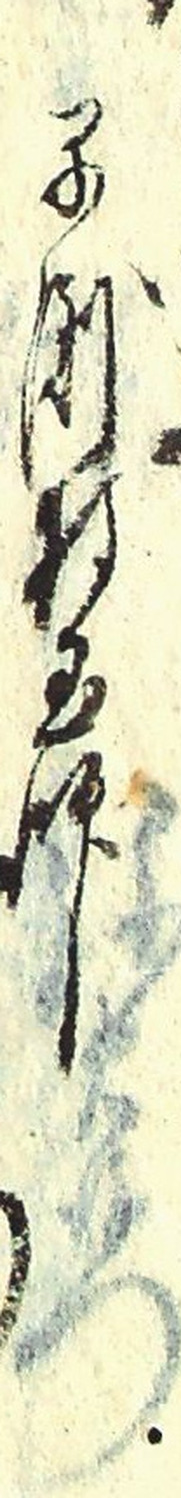早淵村玉師
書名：諸御願書控(弐番）
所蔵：鳴門教育大学 Naruto University of Education
